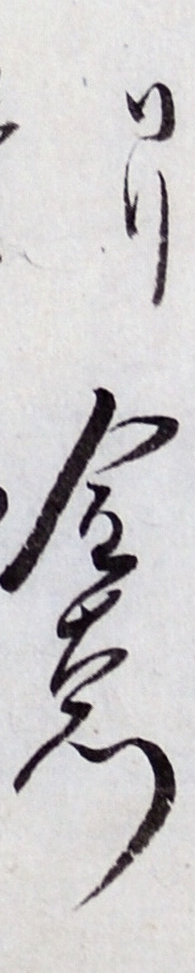同断金右衛門
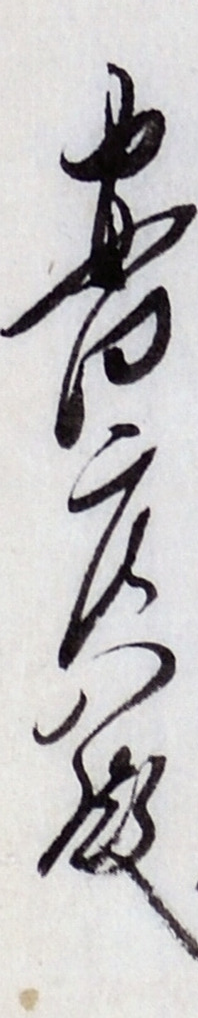安田庄八殿
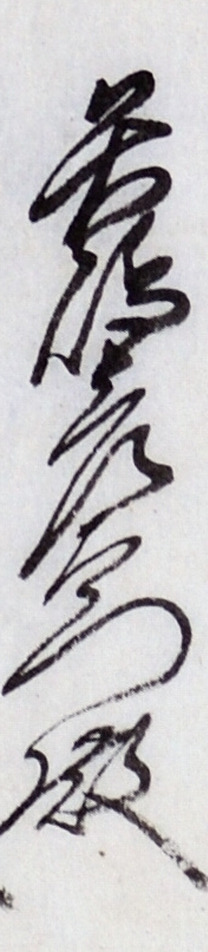矢嶋彦右衛門殿
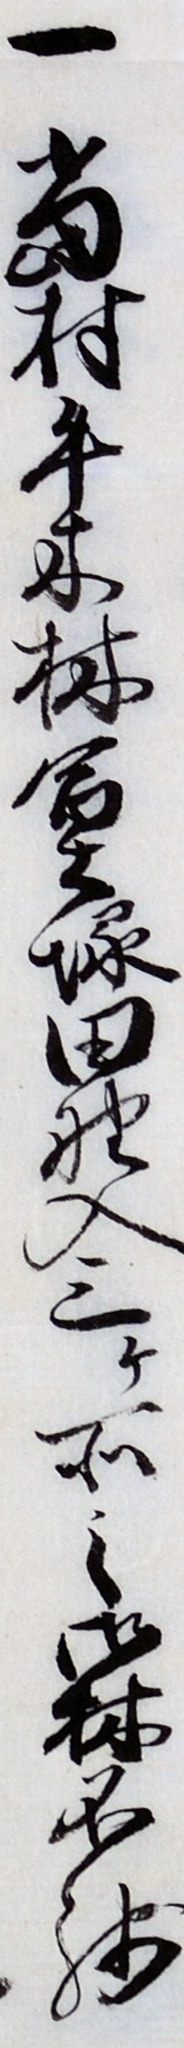一当村牛木林冨士塚田野入三ヶ所之御林不残
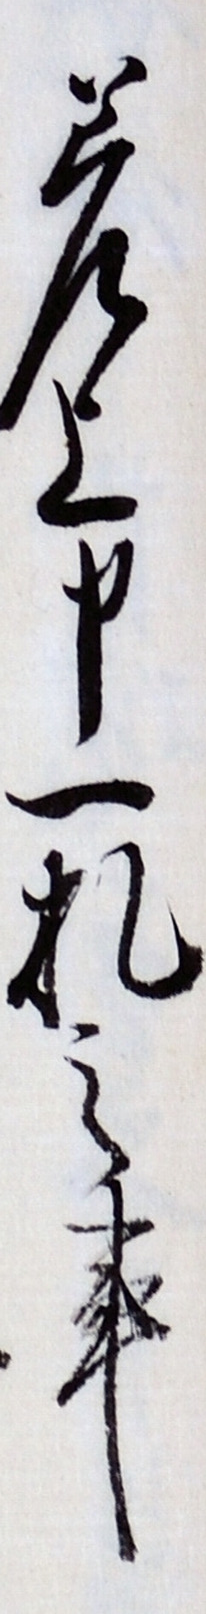差上申一札之事
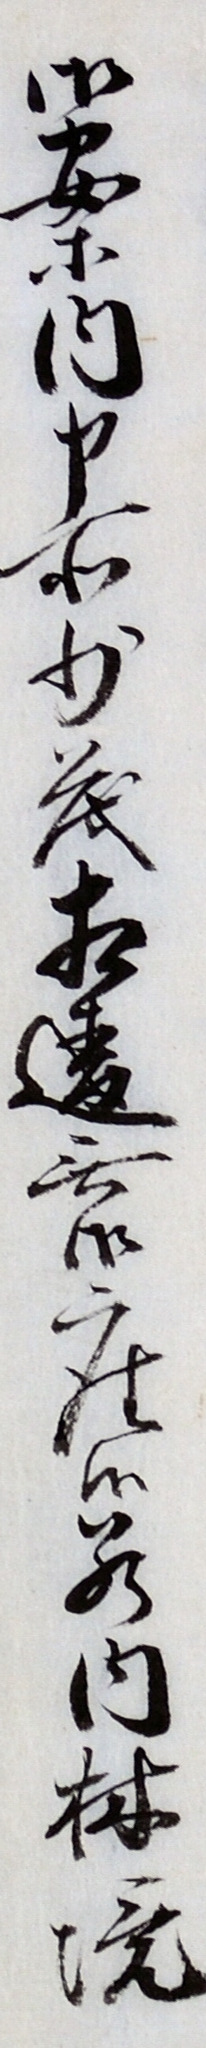御案内申所少も相違無御座候若内林境
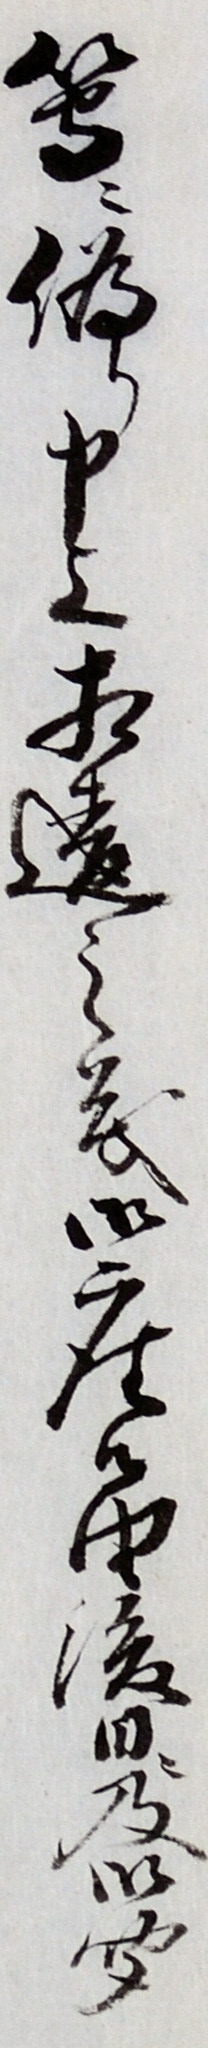等ニ偽り申上相違之義御座候由後日ニ及御聞
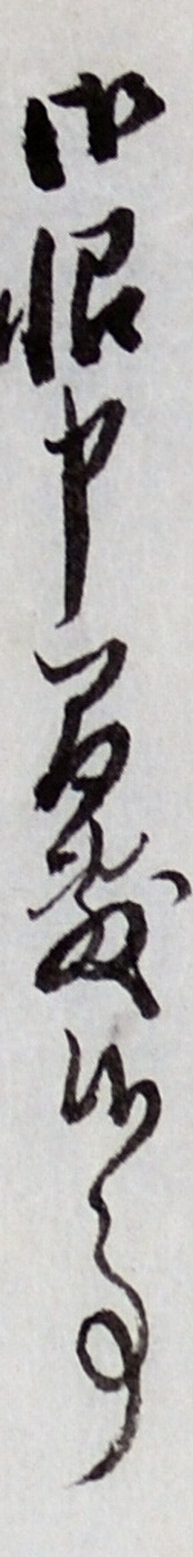御恨申間敷候事
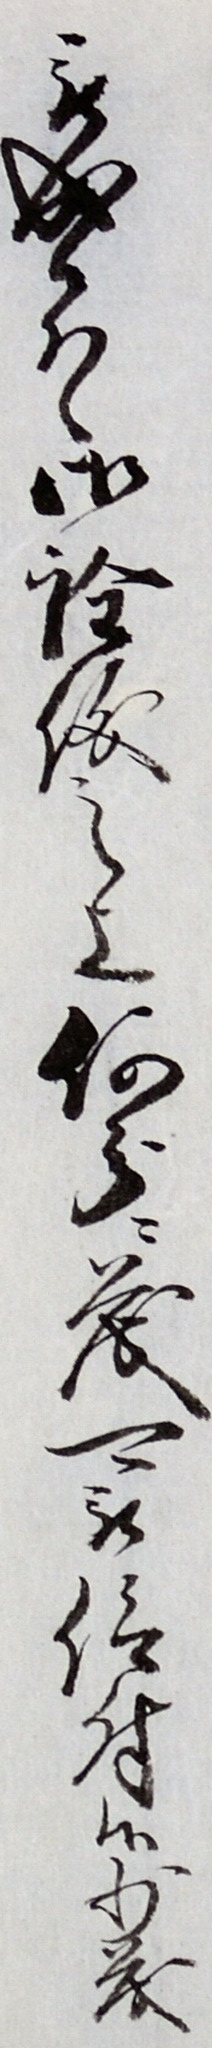被成候ハヽ御詮儀之上何分ニも可被仰付候少も
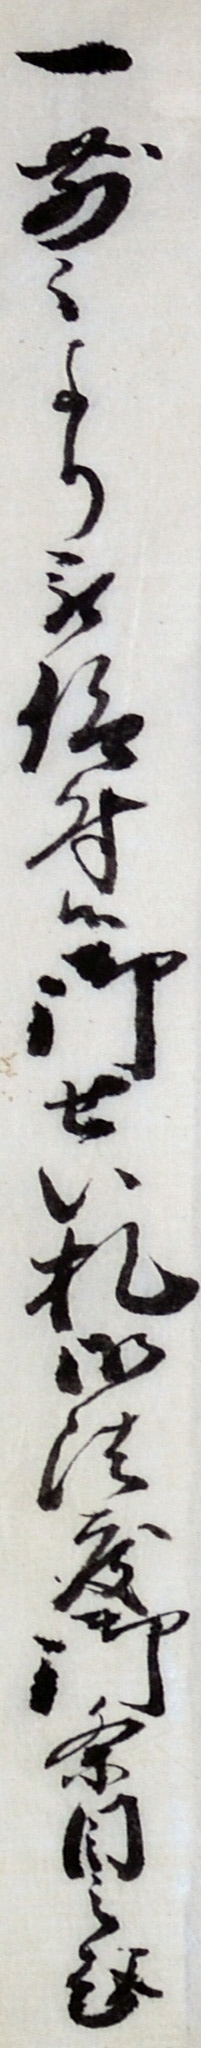一前々より被仰付候御せい札御法度御条目之趣
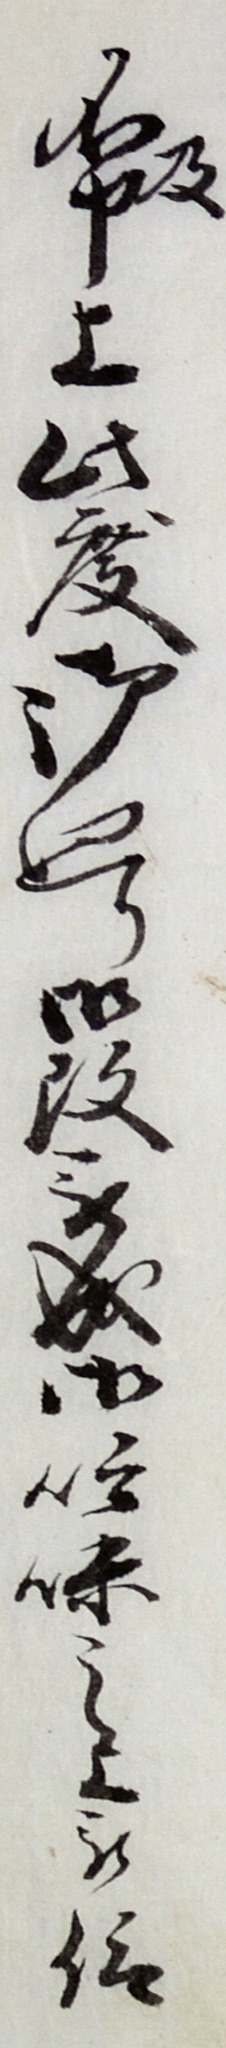不及申上此度御廻り御改被成御吟味之上被仰

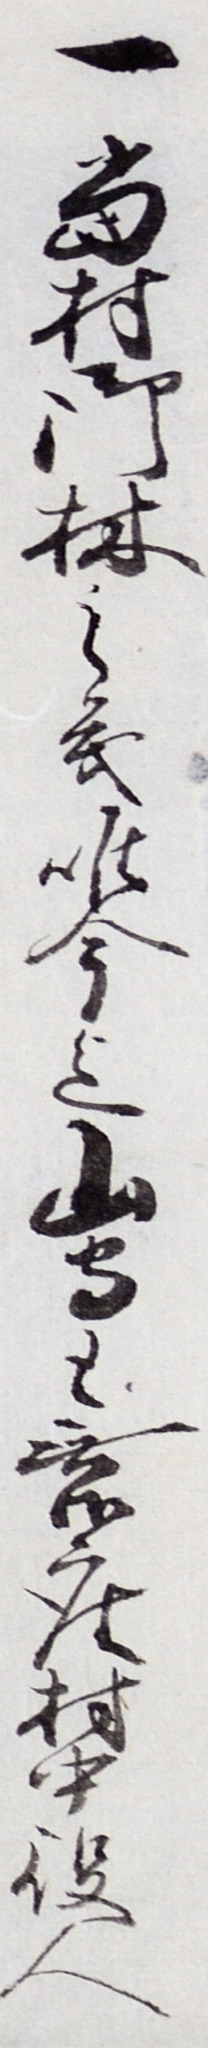一当村御林之義唯今迄山守も無御座村中役人
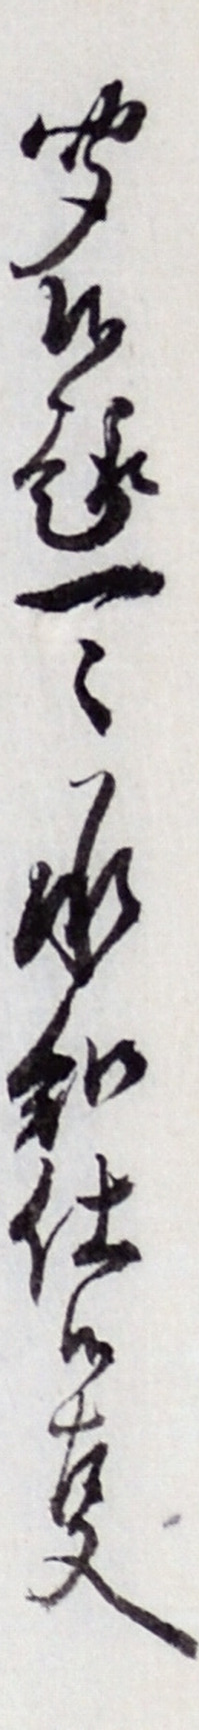聞候趣一々承知仕候事
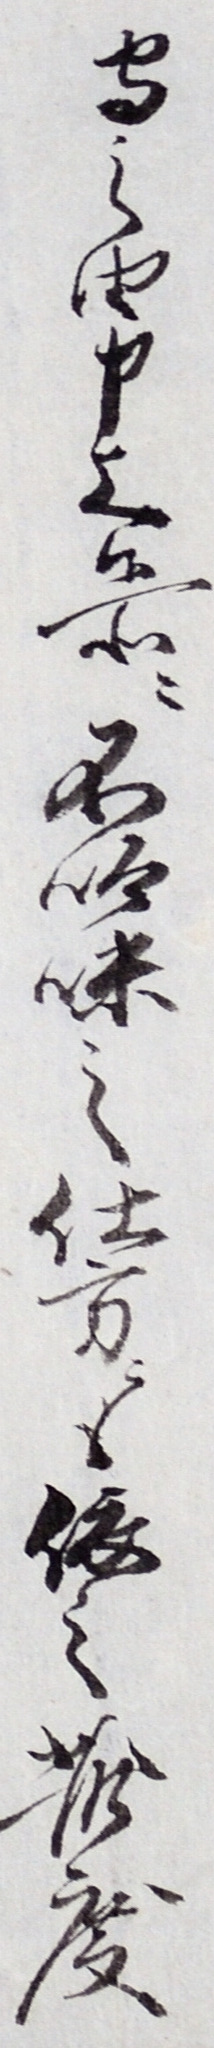守之由申上候所ニ不吟味之仕方ニも依之此度
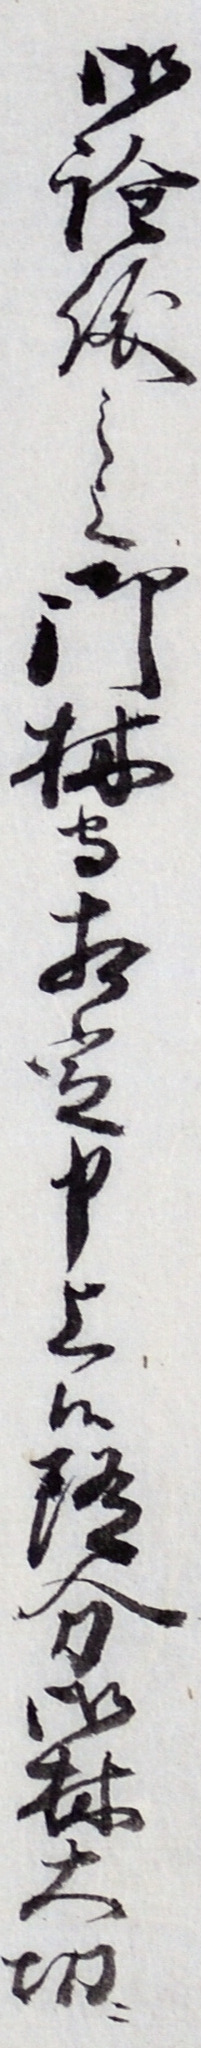御詮儀之上御林守相定申上候随分御林大切ニ
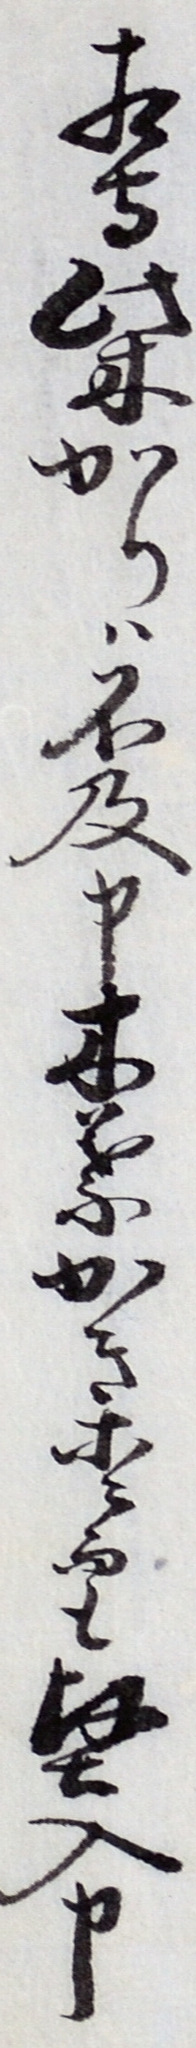相守柴かりハ不及申木葉かき等ニ而も堅入申
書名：御林御竹藪証文控
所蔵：伊那市立高遠町図書館・合同会社AMANE
